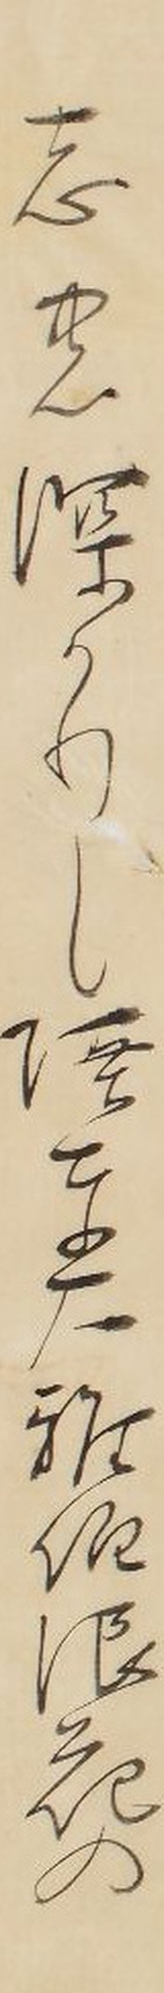志の深かりし陸車大雅伯浪花の
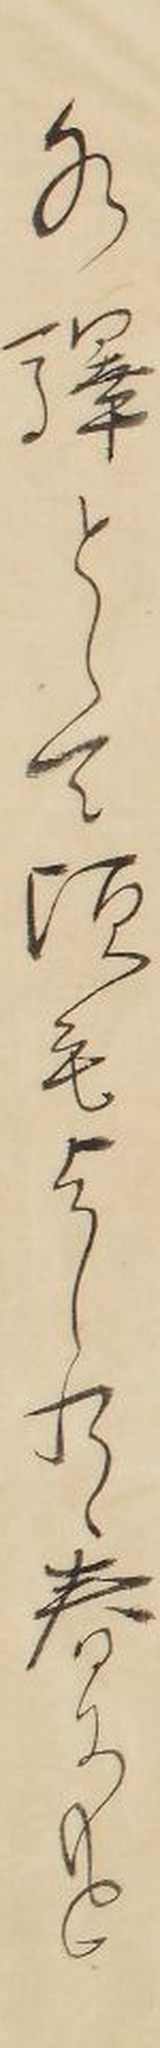水駅として頃もよしのゝ春にもと
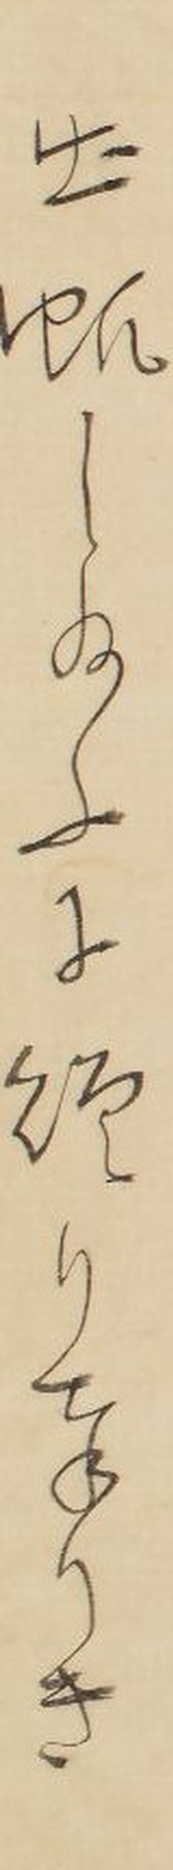出帆し給ふに贈り奉りき

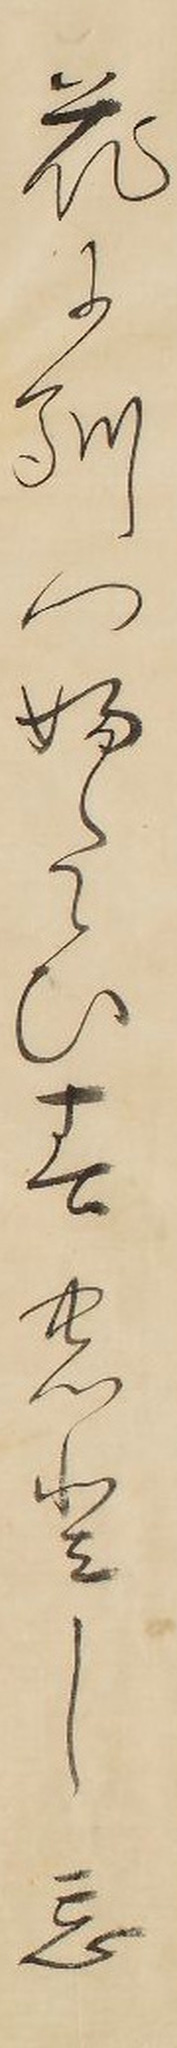花に馴つふたゝひ春のとし忘
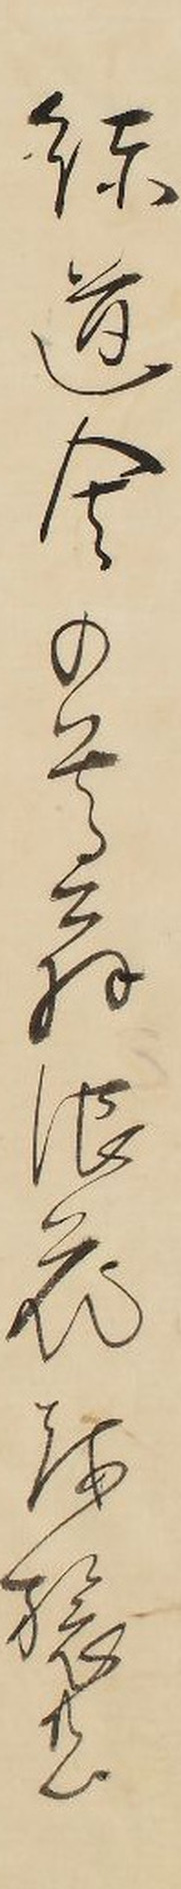練道舎の尊翁浪花を旅の
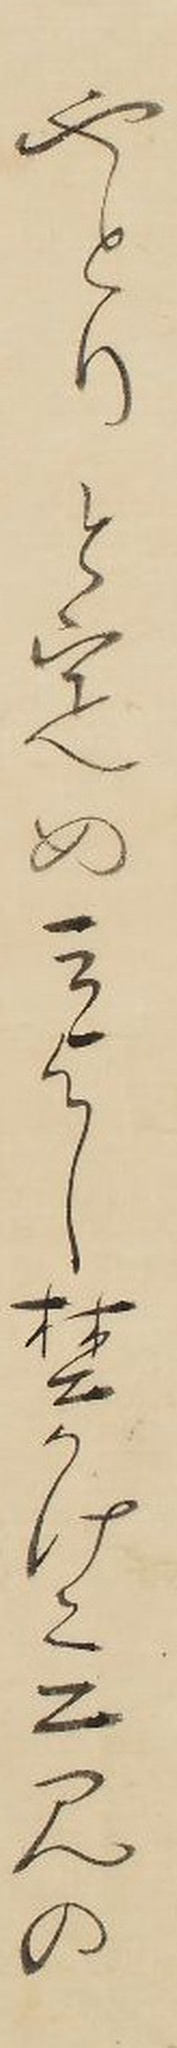やとりと定めみよし野かけて二見のヵ
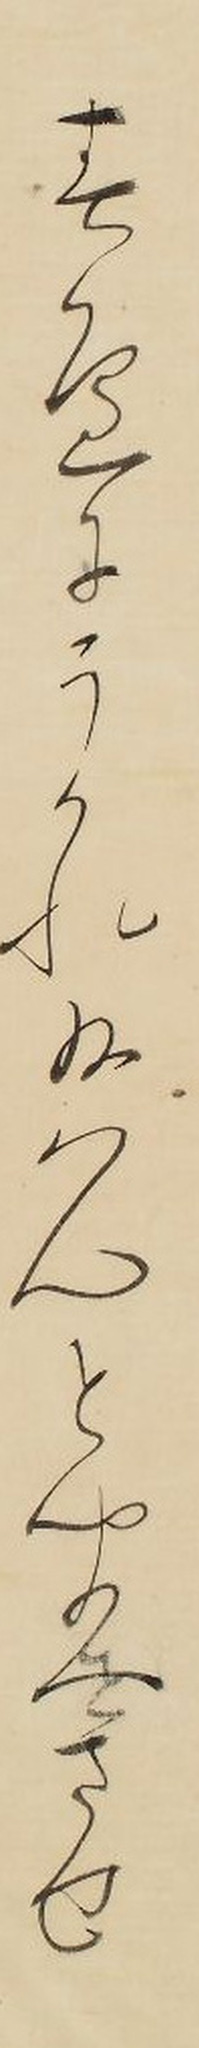春辺にうかれ給はんと聞へさせ
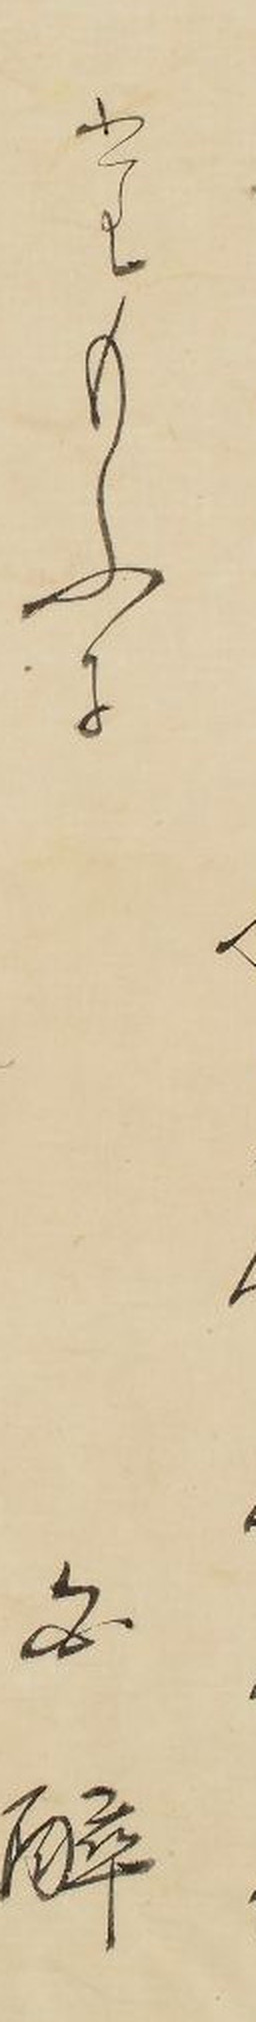たもふに白酔
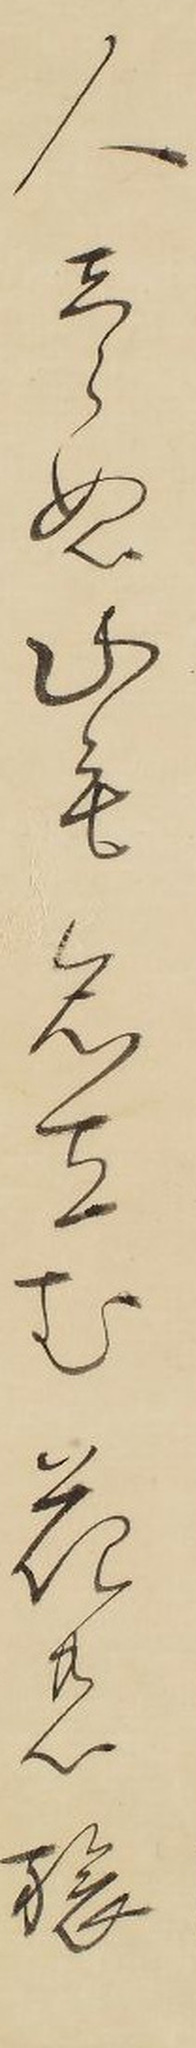人しらぬ山も名立む花の旅
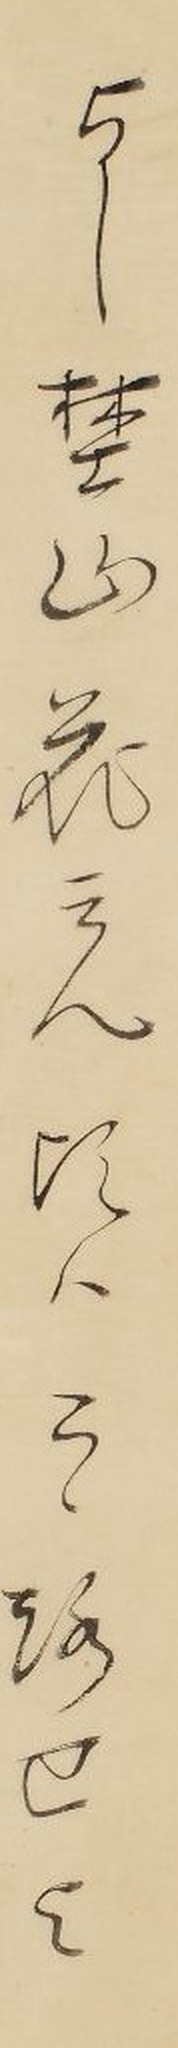よし野山花みん頃はこゝろせよ
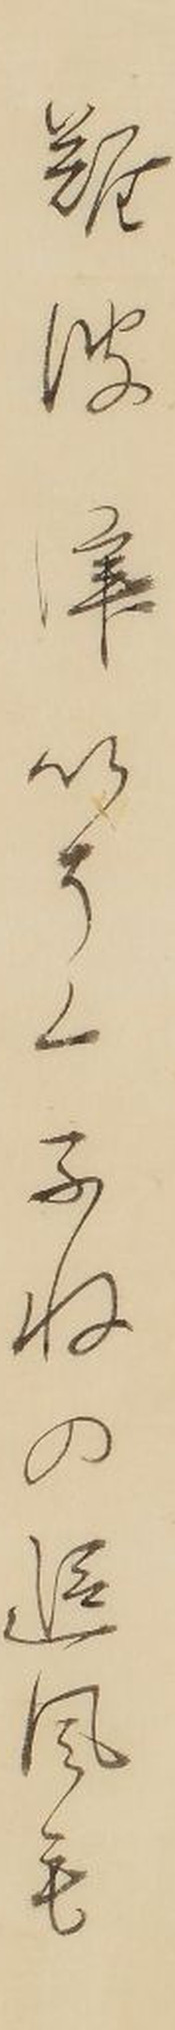難波津いそくふねの追風も
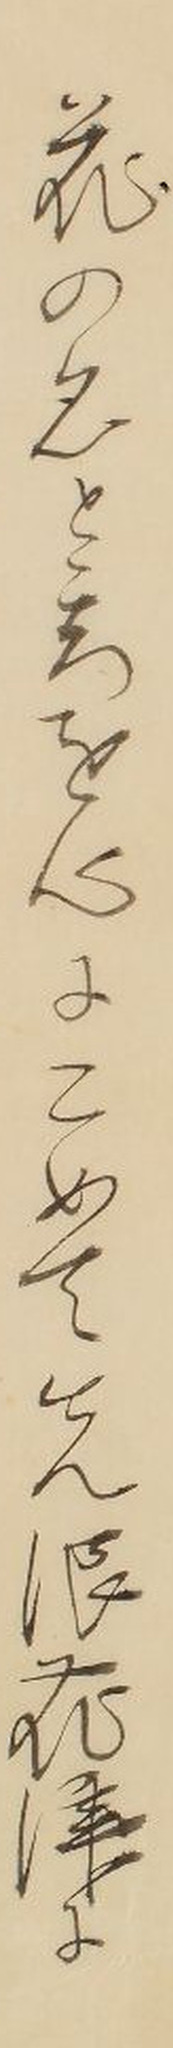花の名ところを心にこめて先浪花津に
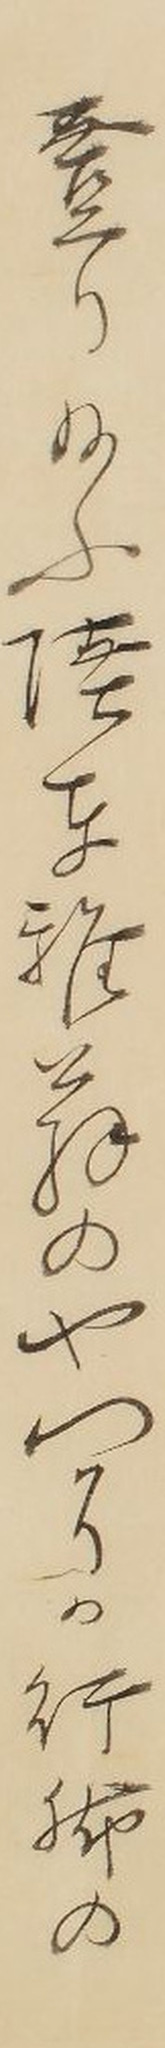登り給ふ陸車雅翁のやつかりか行脚の
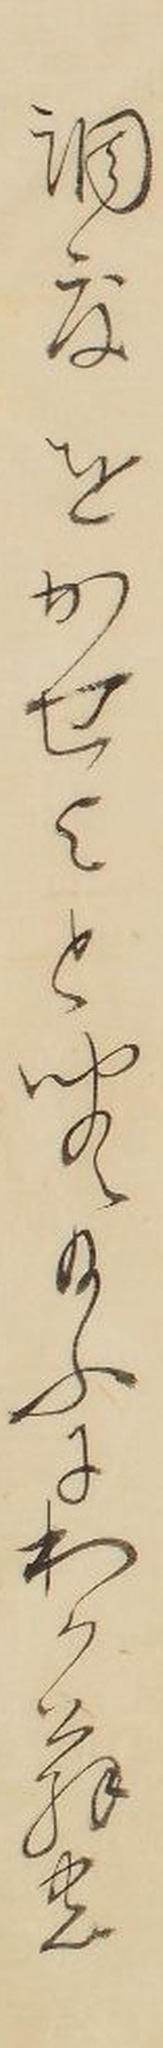調度をかせよと聞給ふにわか翁の
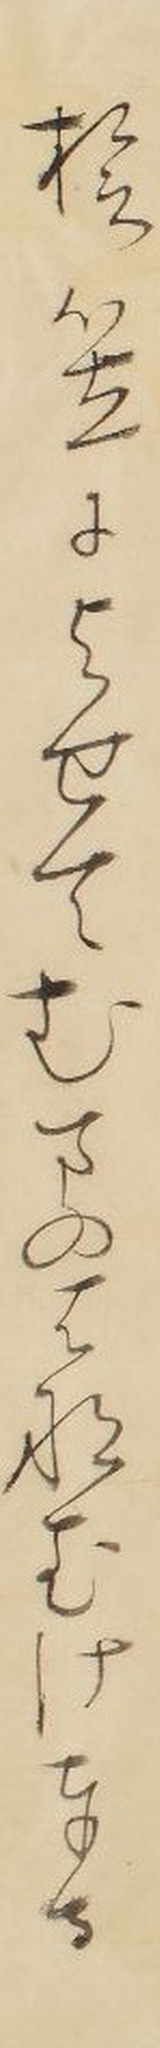桧笠によせてむまのはなむけ奉る
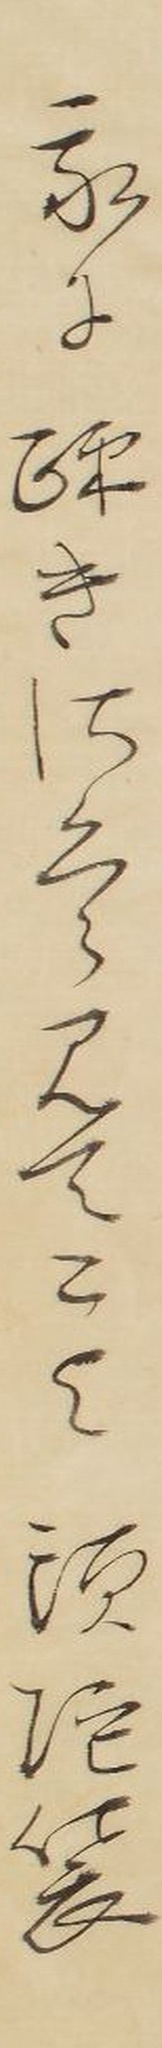我に疎きさくら見てこよ頭陀袋
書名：花土産
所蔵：徳島県立図書館
